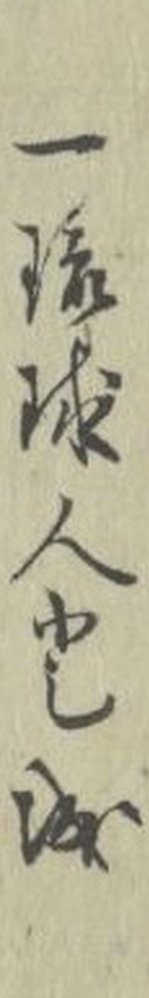一琉球人登城
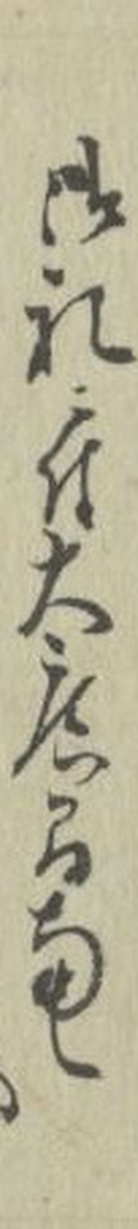御礼に付大広間南之方
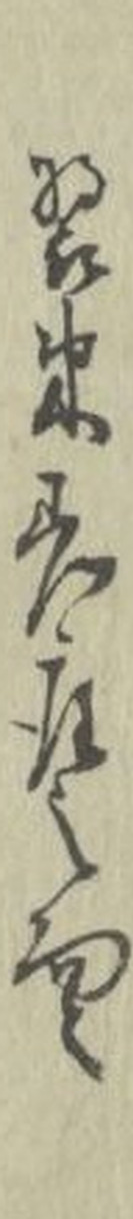装束着座之面々
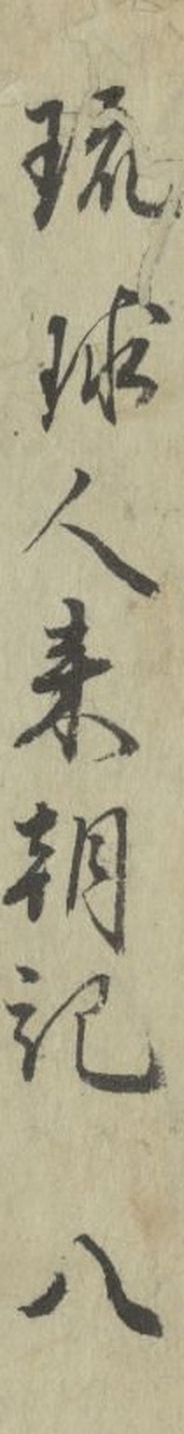琉球人来朝記八

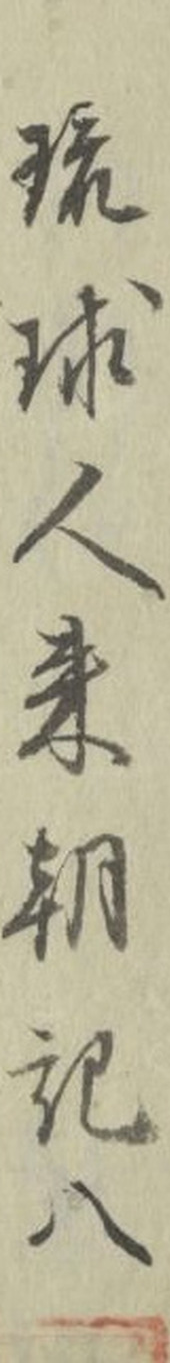琉球人来朝記八
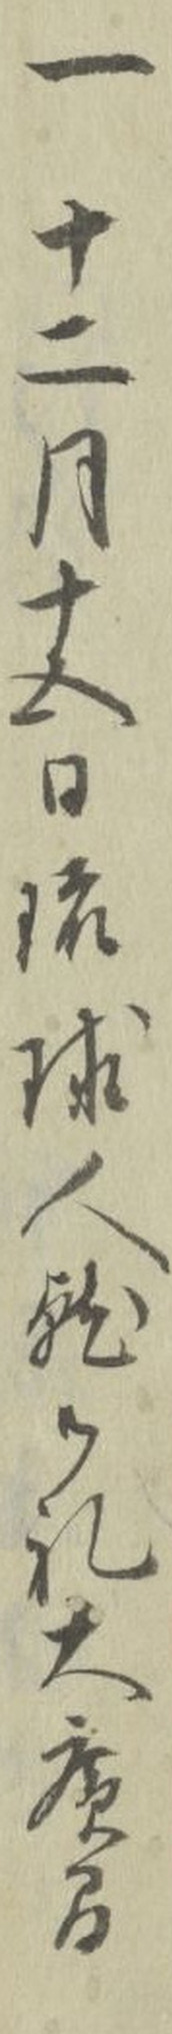一十二月十五日琉球人就御礼大広間
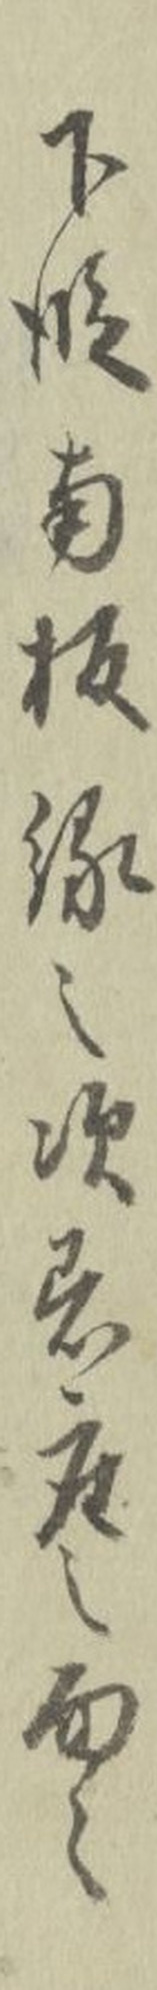下段南板縁之次着座之面々
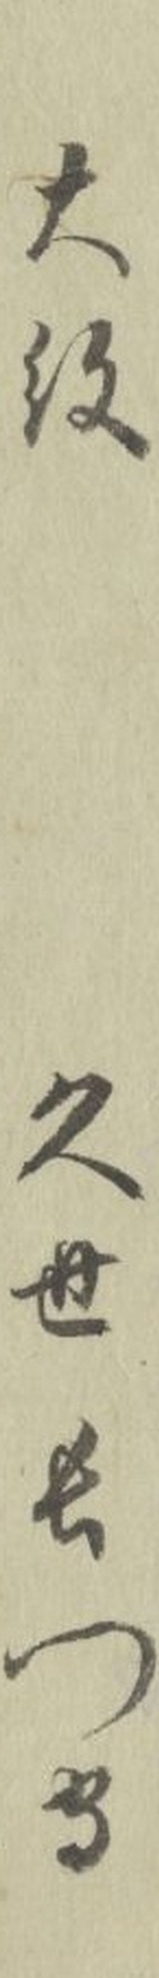大紋久世長門守
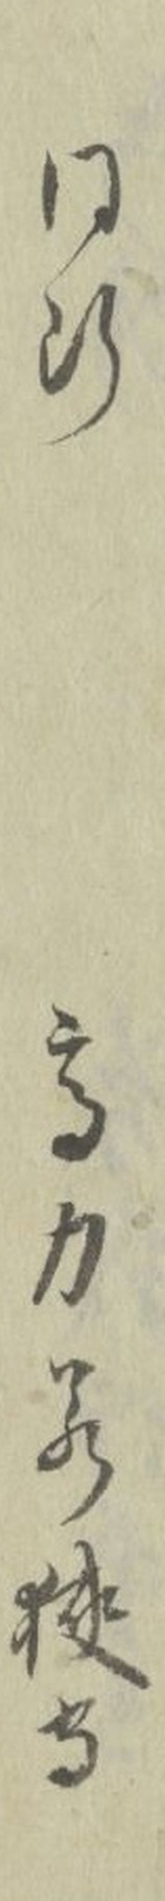同断高力若狭守
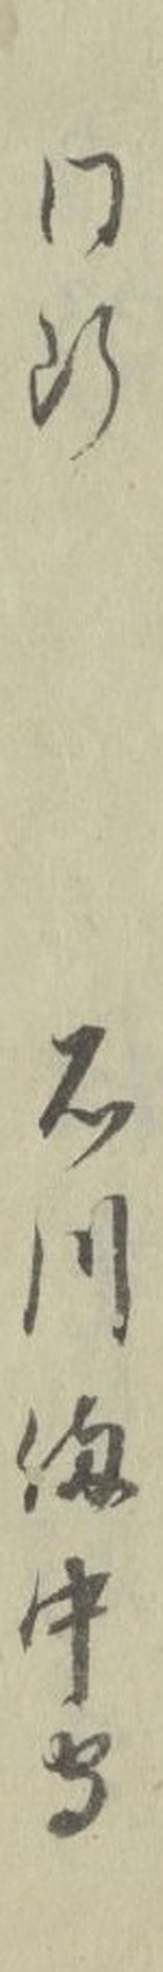同断石川備中守
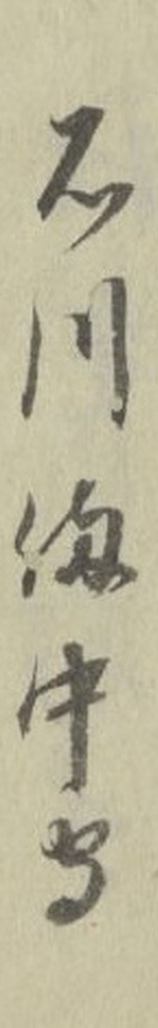同断石川備中守

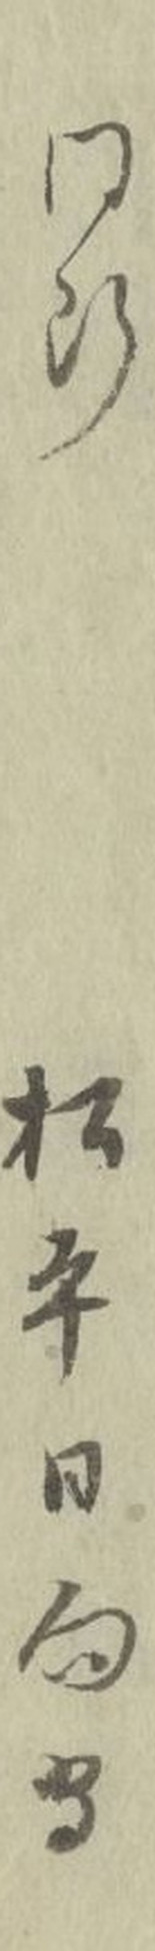同断松平日向守
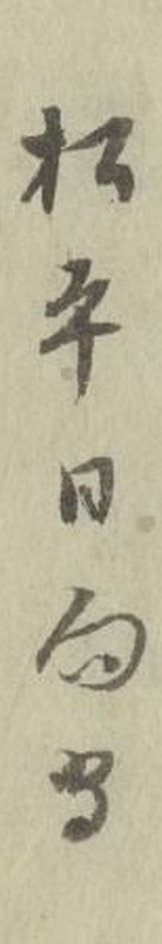同断松平日向守
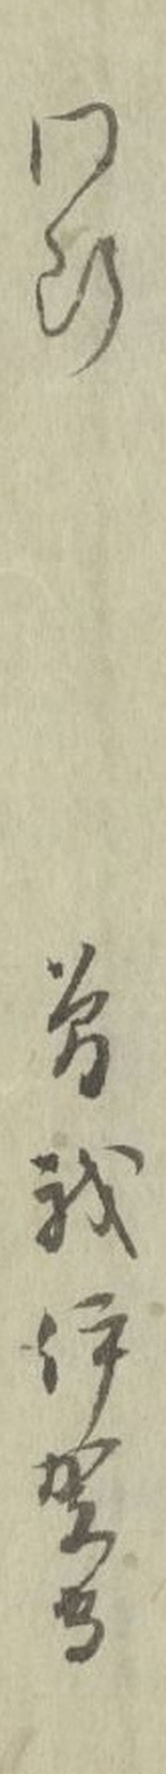同断曽我伊賀守
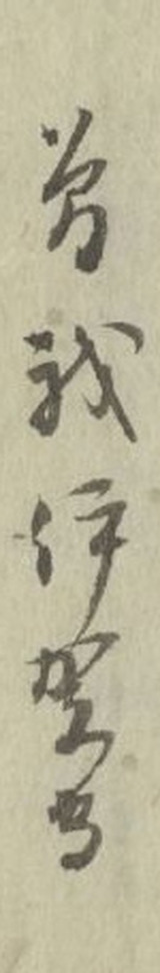同断曽我伊賀守
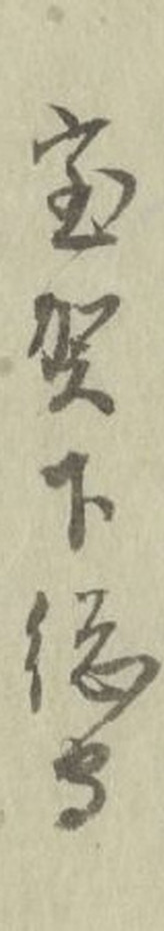同断宝賀下総守
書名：琉球来朝記 自八至十四終
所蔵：University of the Ryukyus Library
